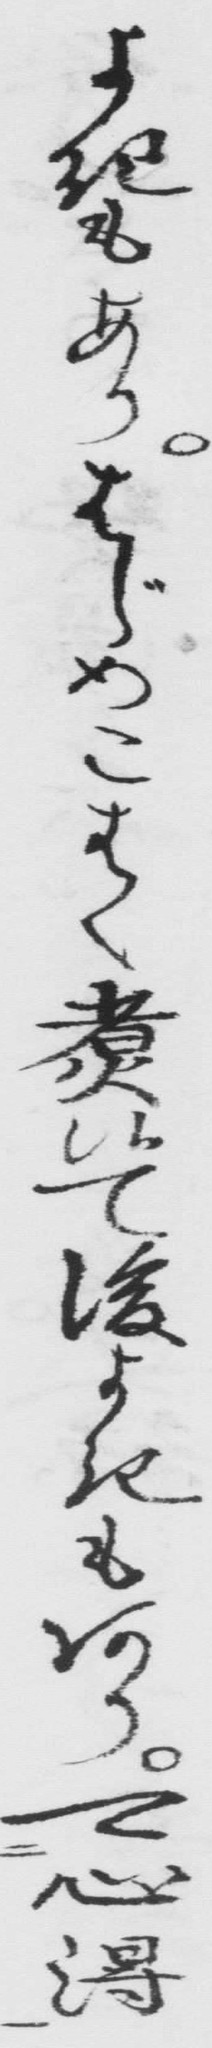よきもあり。はじめこはく煮候て後よきもあり。可心得
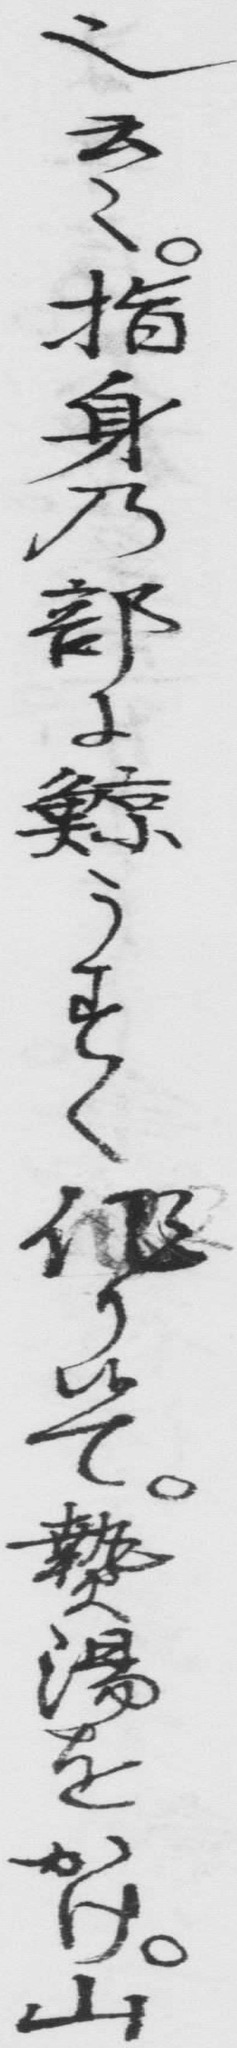也云々。指身の部に鯨うすく作り候て。熱湯をかけ。山
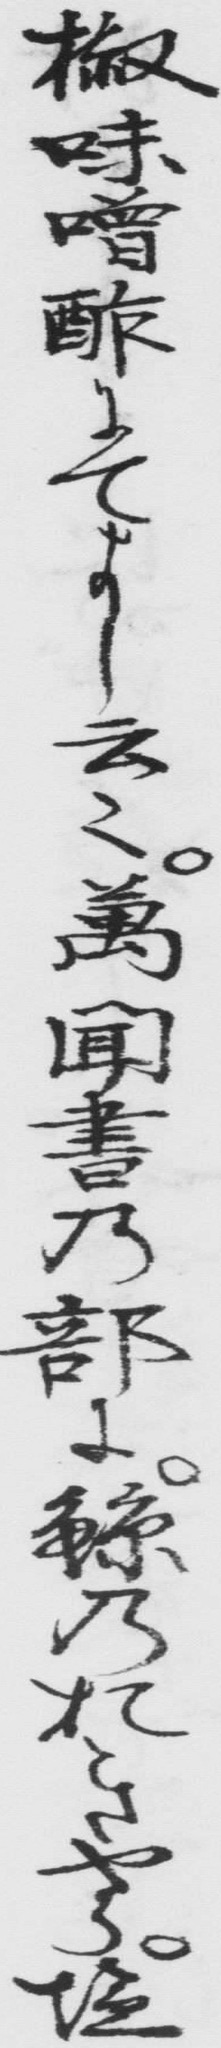椒味噌酢にてよし云々。萬聞書の部に。鯨のおきやう。塩
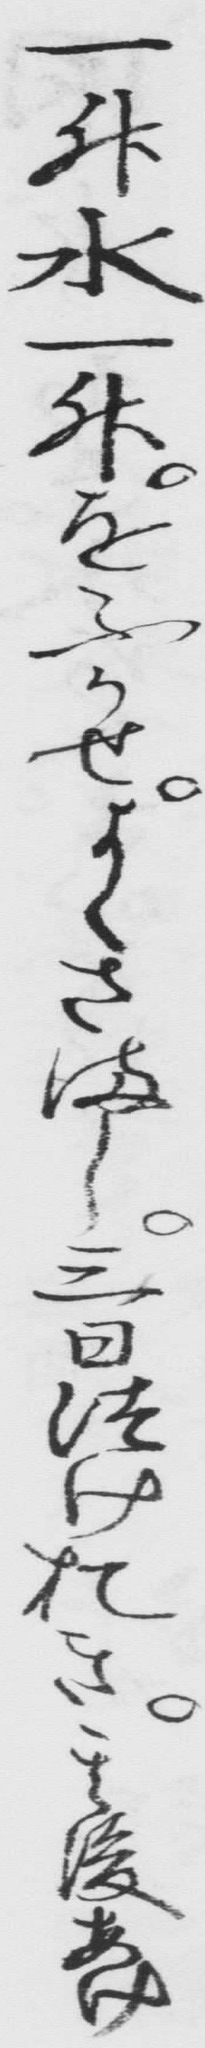一升水一升。をふかせ。よくさまし。三日つけおき。其後あけ
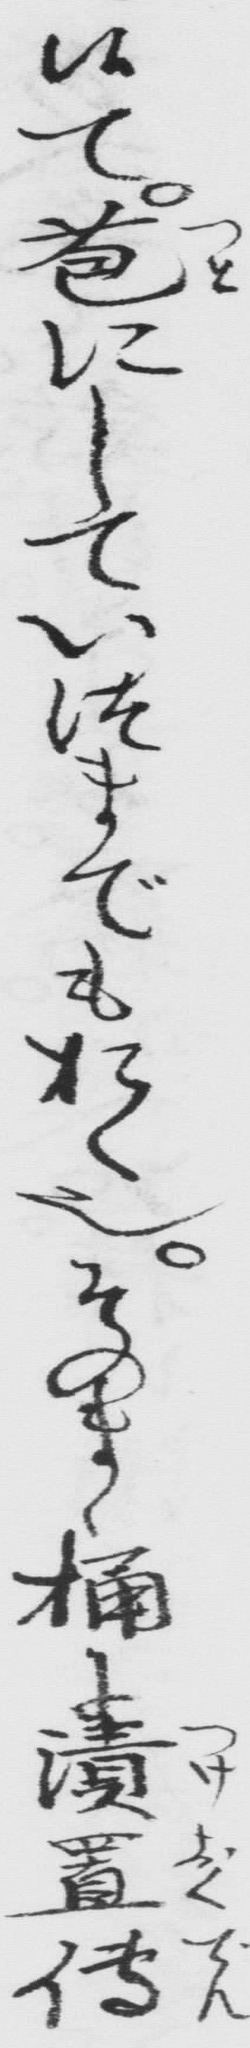候て。苞にしていつまでもおく也。そのまま桶に漬置伝
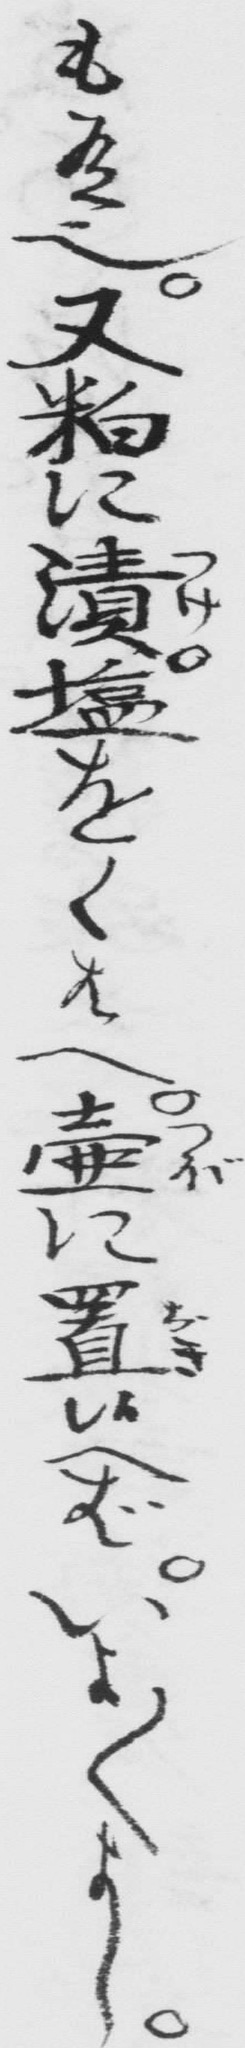も有也。又粕に漬。塩をくはへ。壺に置候へば。いよ〳〵よし。
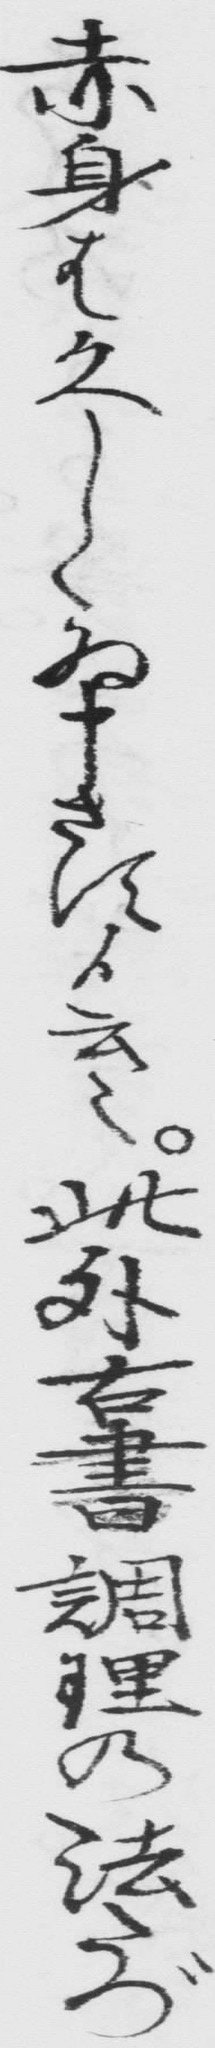赤身は久しくゐ申さす候云々。此外古書調理の法たづ
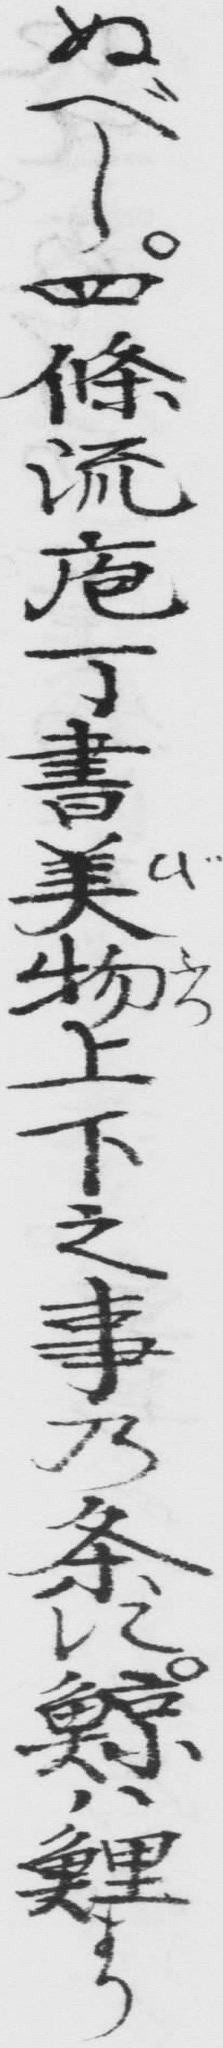ぬべし。四條流包丁書美物上下之事の条に。鯨は鯉より
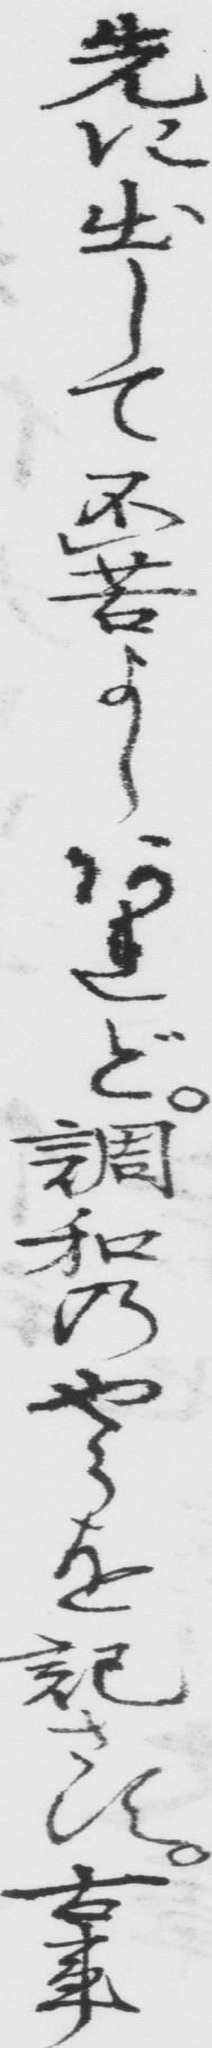先に出して不苦よしあれど。調和のやうを記さず。古事
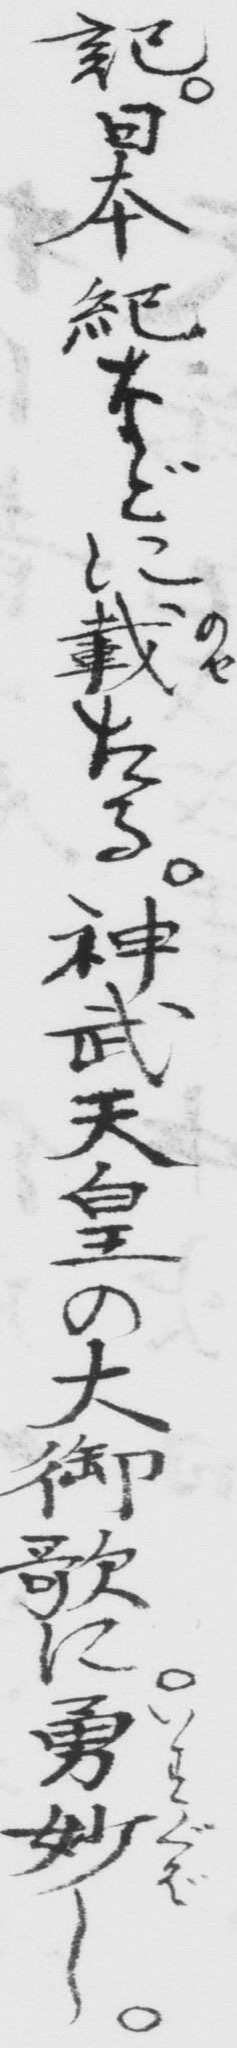記。日本紀などに載たる。神武天皇の大御歌に。勇妙し。
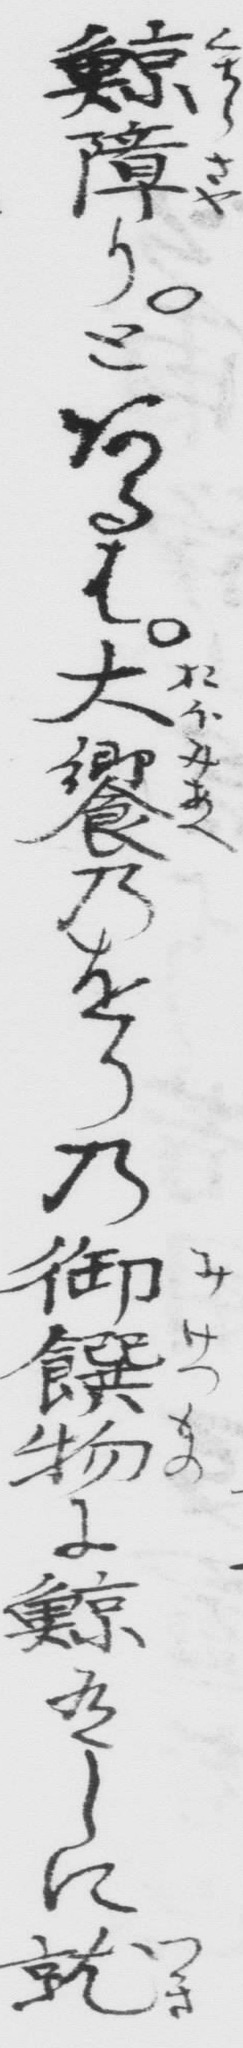鯨障り。とあるは。大饗のをりの御饌物に鯨有しに就
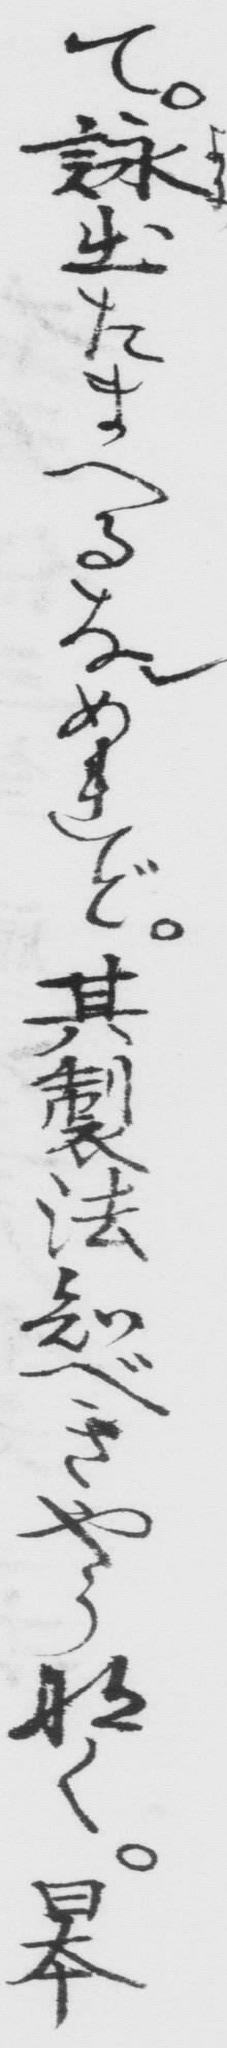て。詠出たまへるなんめれど。其製法知べきやうなく。日本
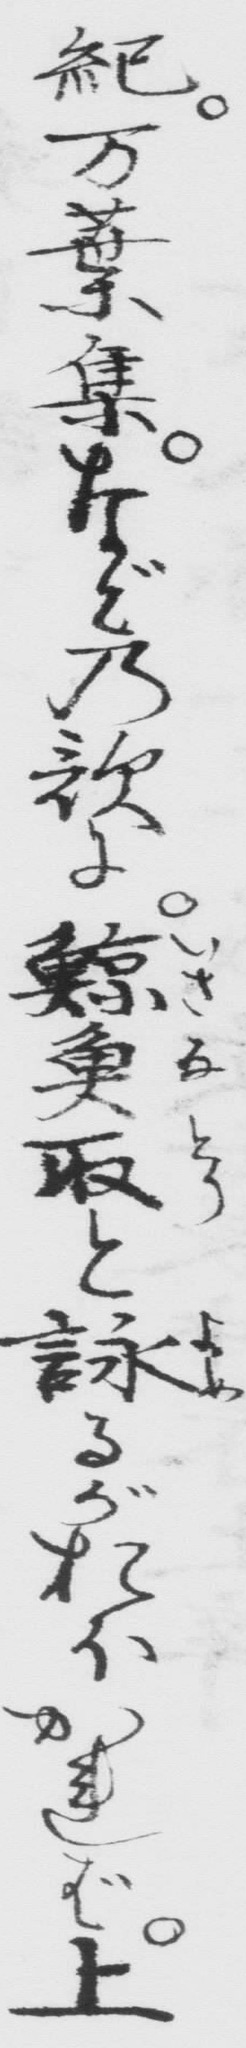紀。万葉集。などの歌に。鯨魚取と詠るがおほかれば。上
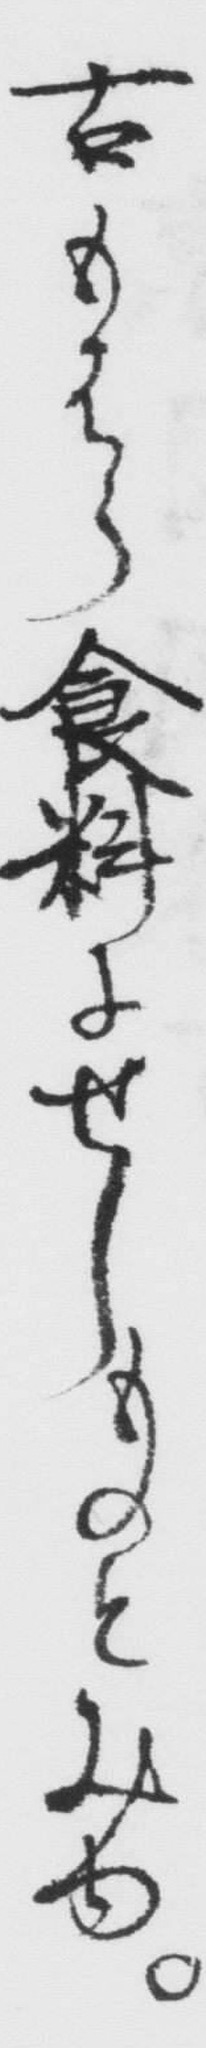古もはら食料にせしものとみゆ。

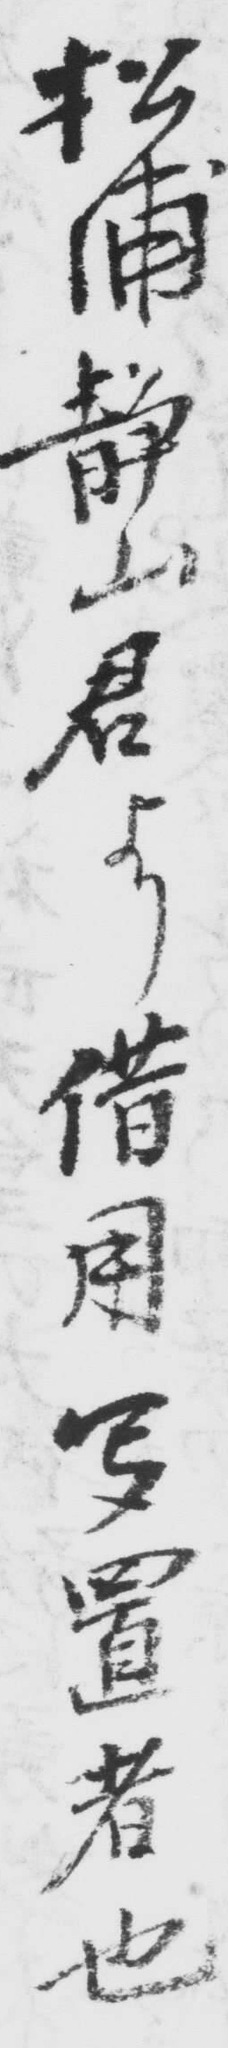松浦静山君より借用写置者也
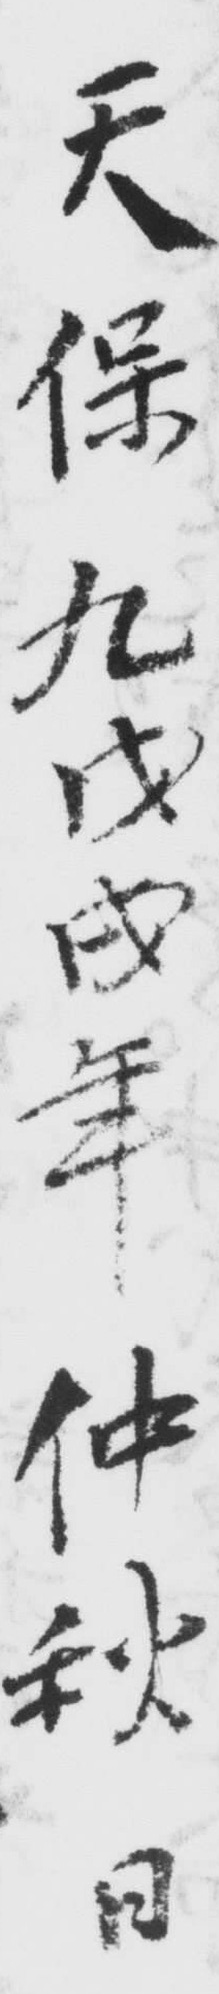天保九戊戌年仲秋日
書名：鯨肉調味方
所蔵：大阪府立大学学術情報センター 国文学研究資料館
